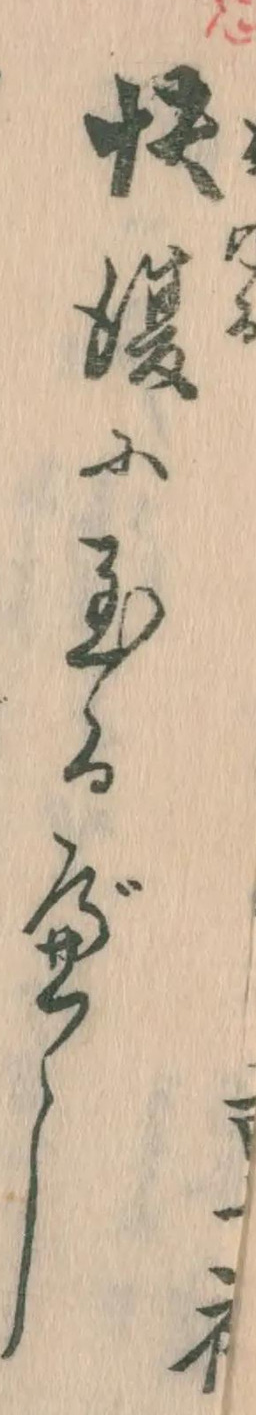快復に至るべし
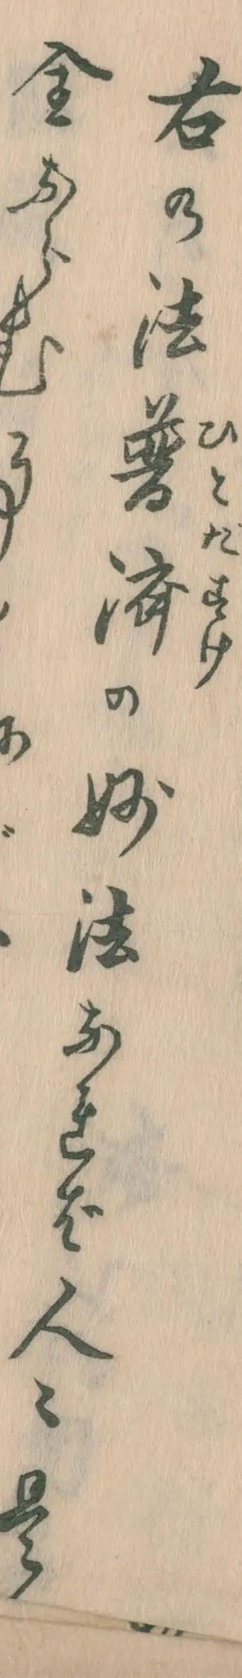右の法普済の妙法なれば人々是
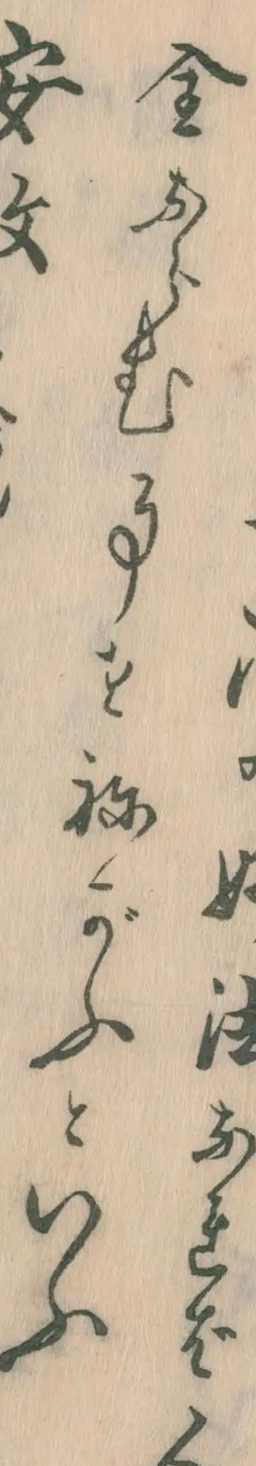全ならむ事をねがふといふ
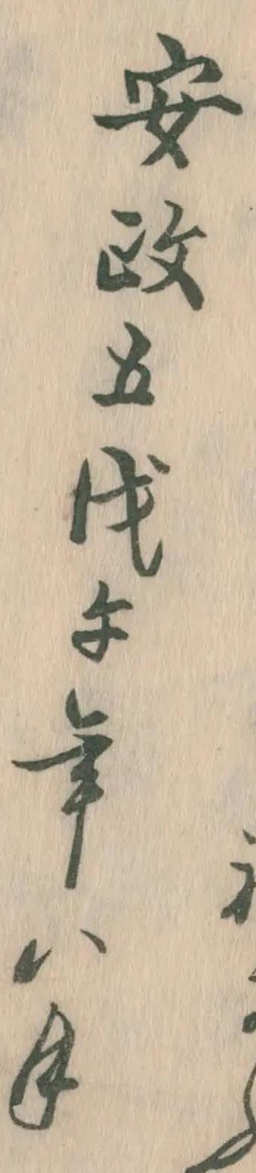安政五戌午年八月

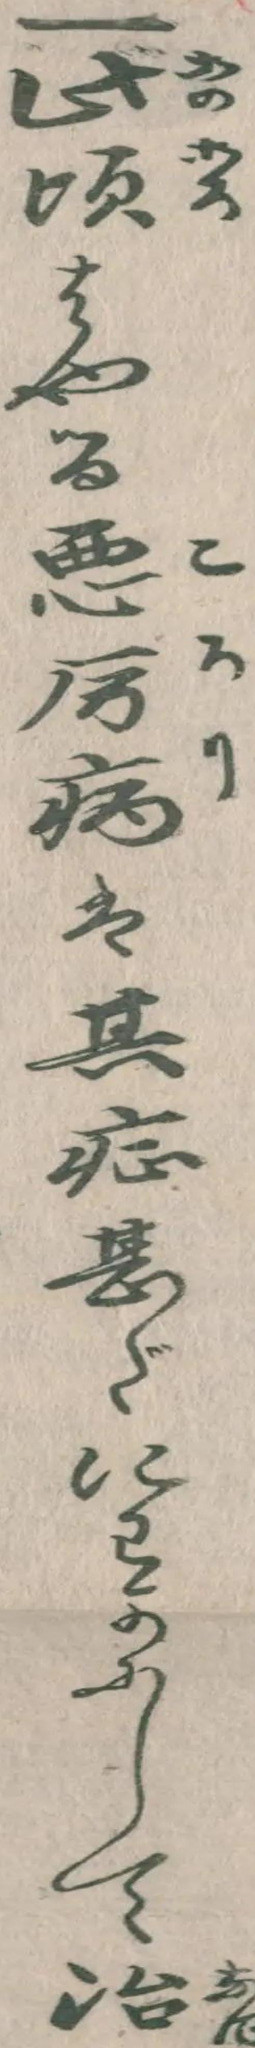一此頃はやる悪厲病は其症甚だにわかにして治
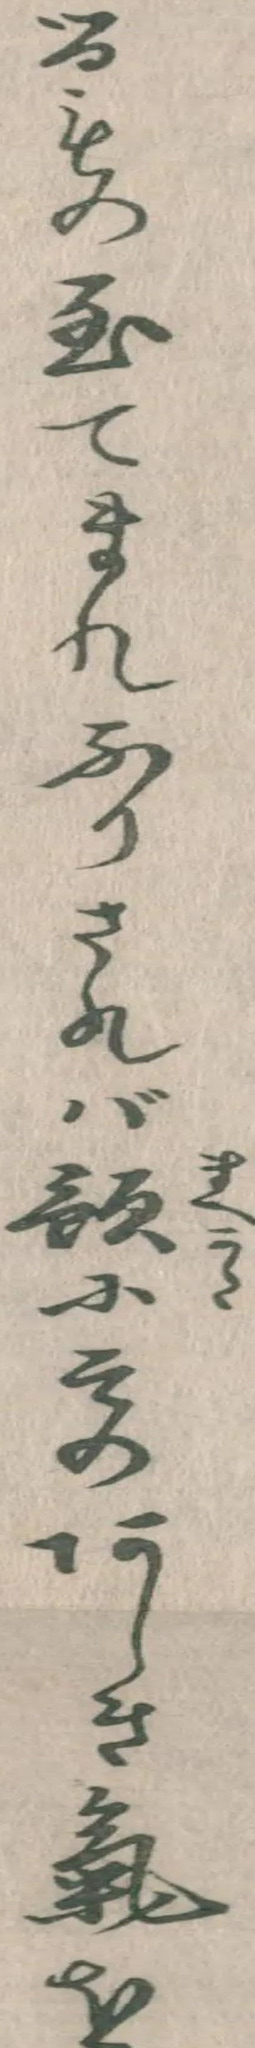るもの至てまれなりされば預そのあしき気を
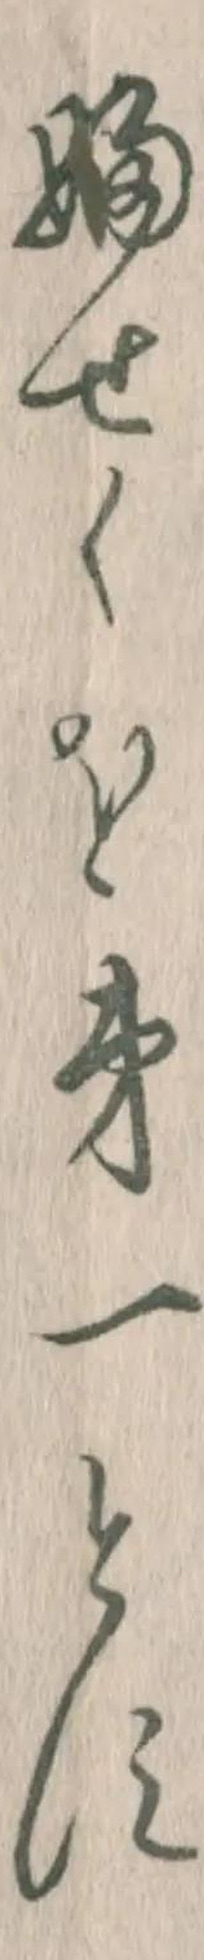ふせくを第一とす
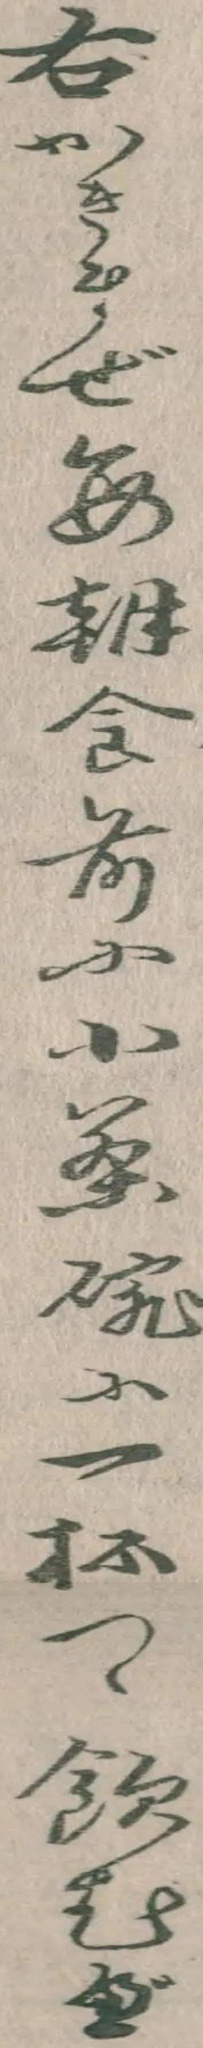右かきまぜ毎朝食前に小茶碗に一杯つゝ飲むべ
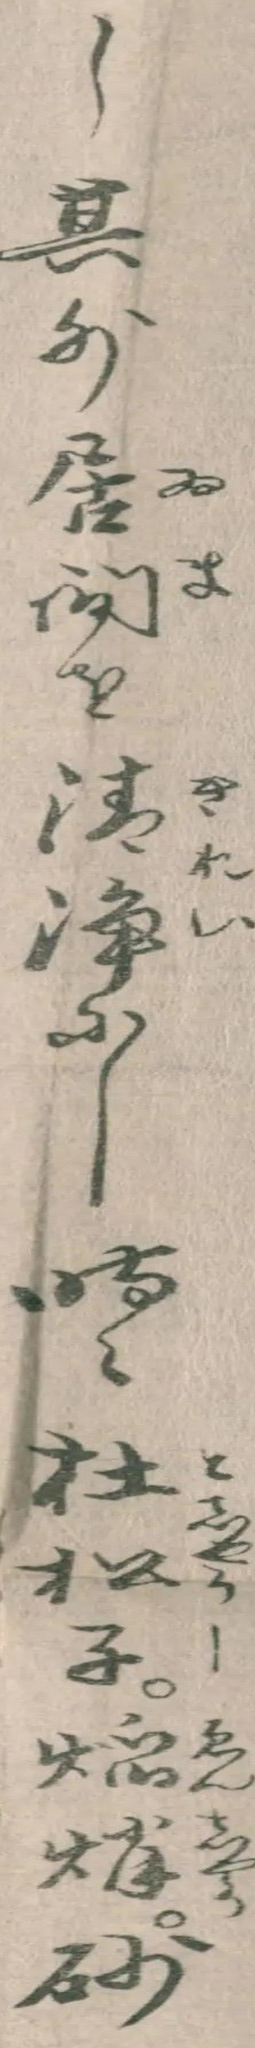し其外居間を清浄にし時々杜松子。焰焇。砂
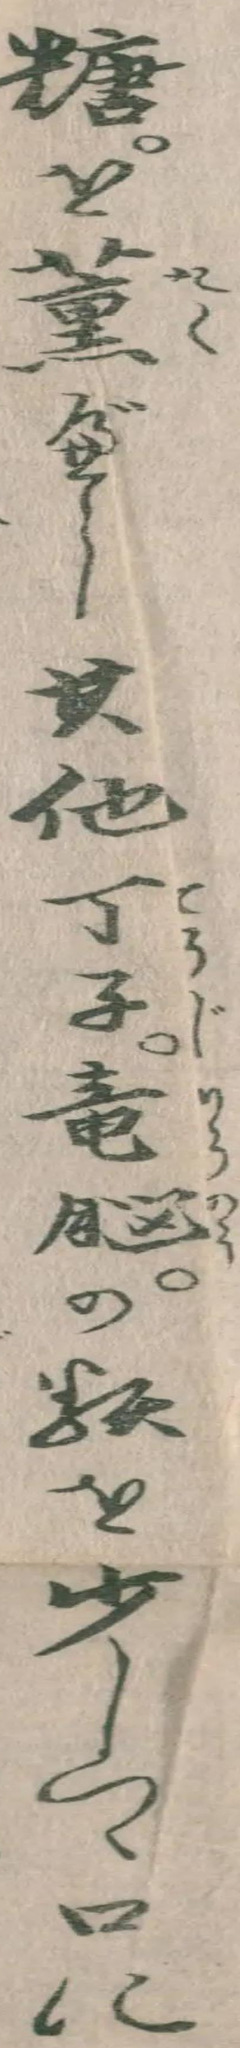糖。を薫べし其他丁子。竜脳。の類を少しつゝ口に
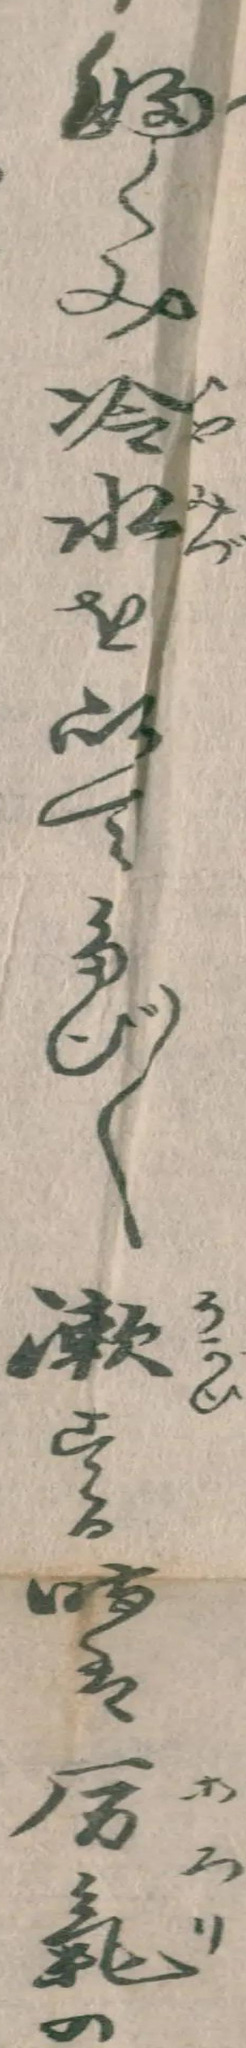ふくみ冷水を以てたび〳〵漱する時は厲気の
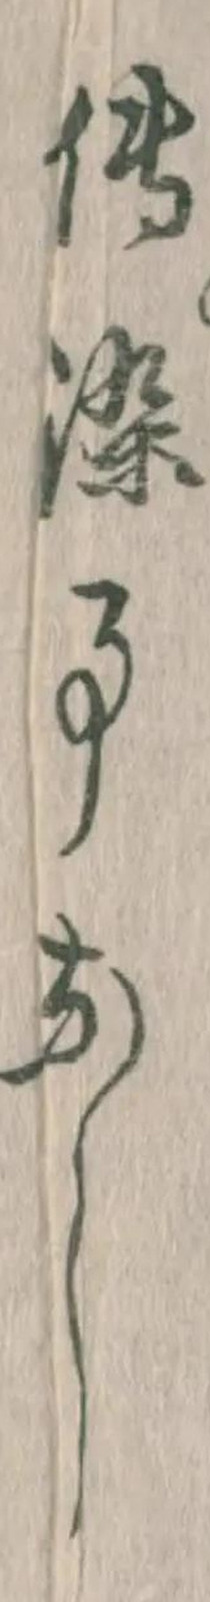伝染事なし
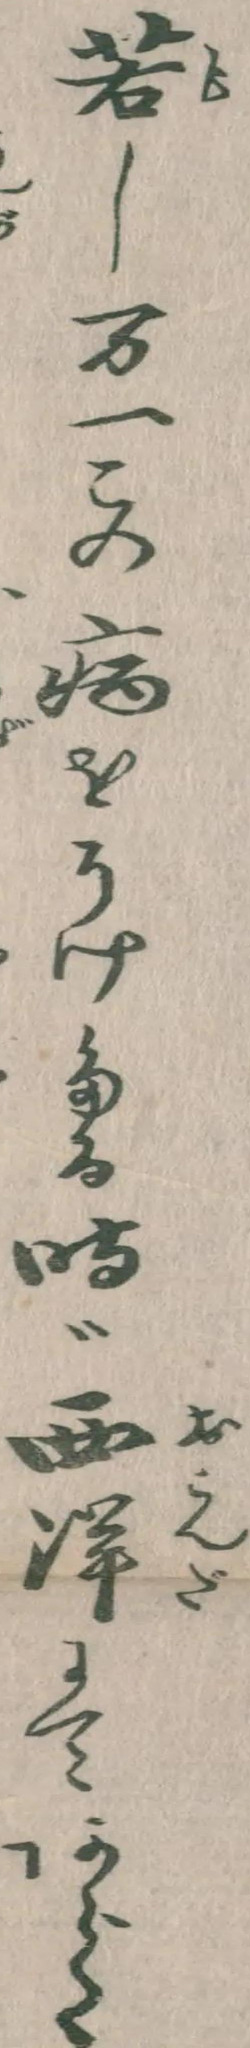若し万一この病をうけたる時は西洋にてあらた
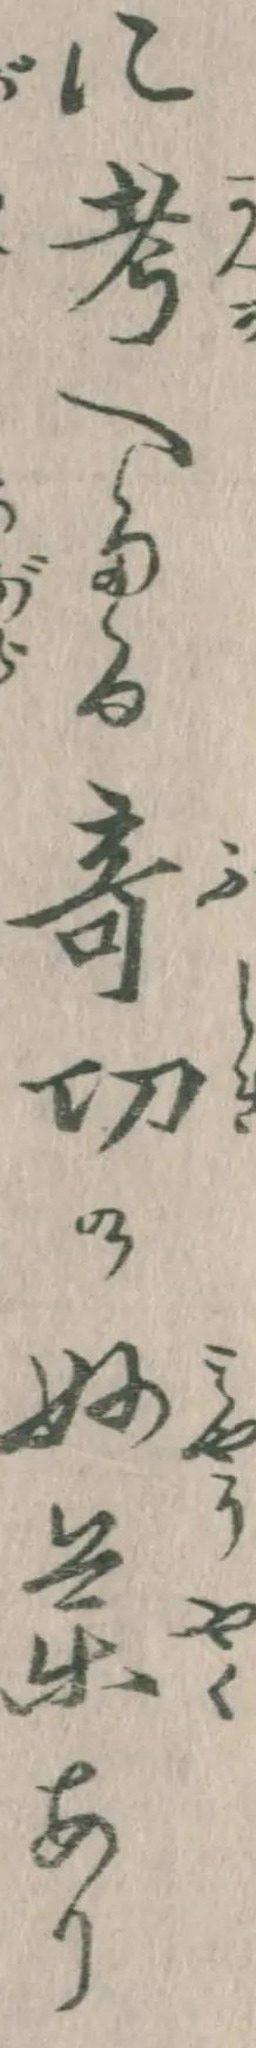に考へたる奇功の妙薬あり
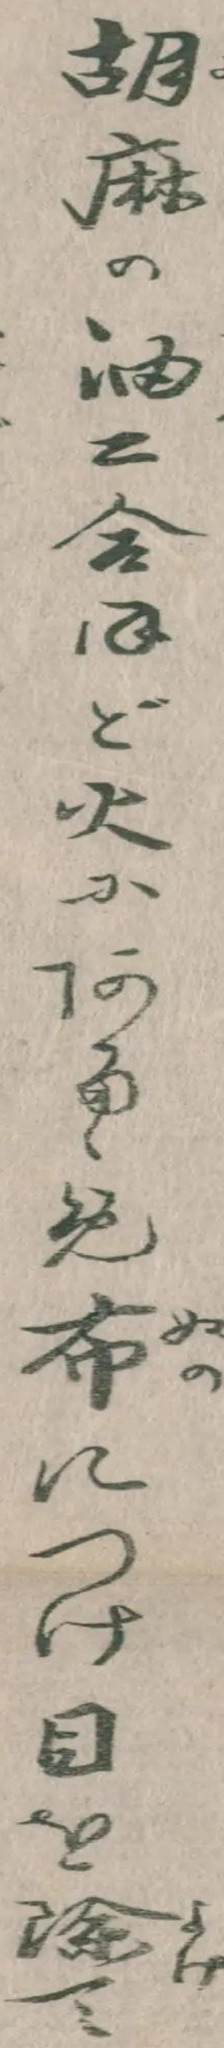胡麻の油二合ほど火にあたゝめ布につけ目を除て
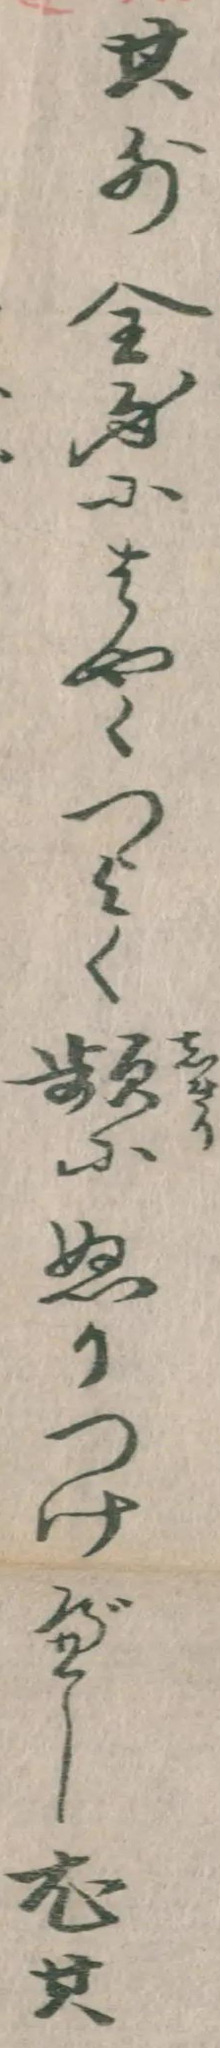其外全身にはやくつよく頻にぬりつけべし尤其
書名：暴瀉病手当素人心得書
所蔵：国立国会図書館 National Diet Library, JAPAN
